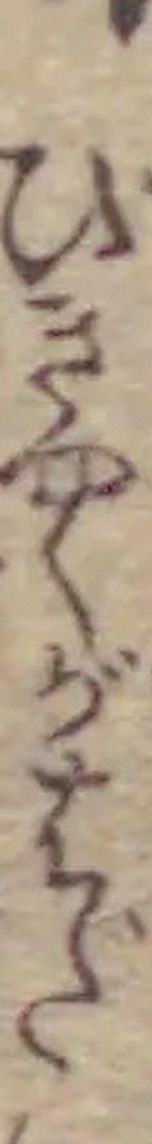ひきやくがはだ
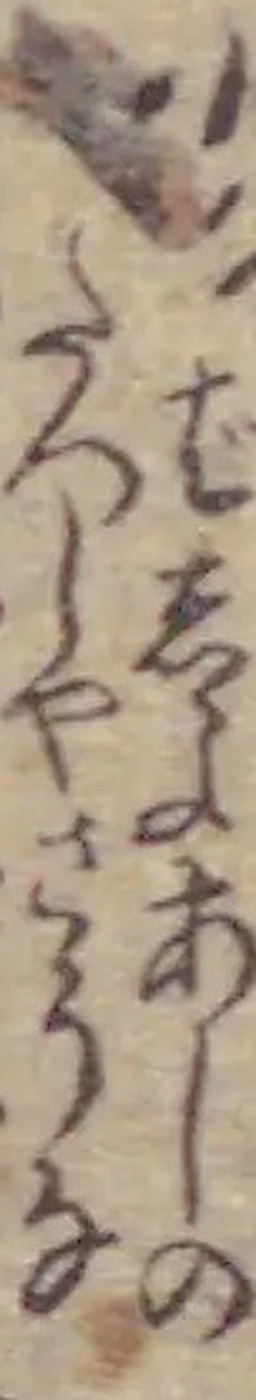たつしやさうな
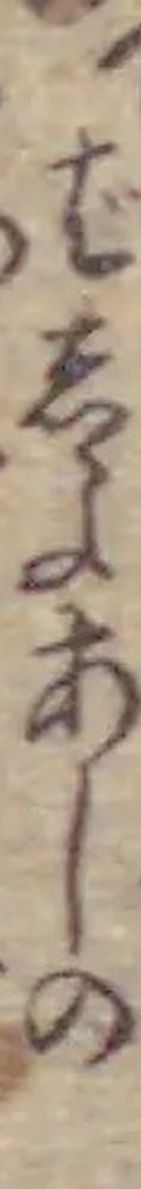ばしよあしの
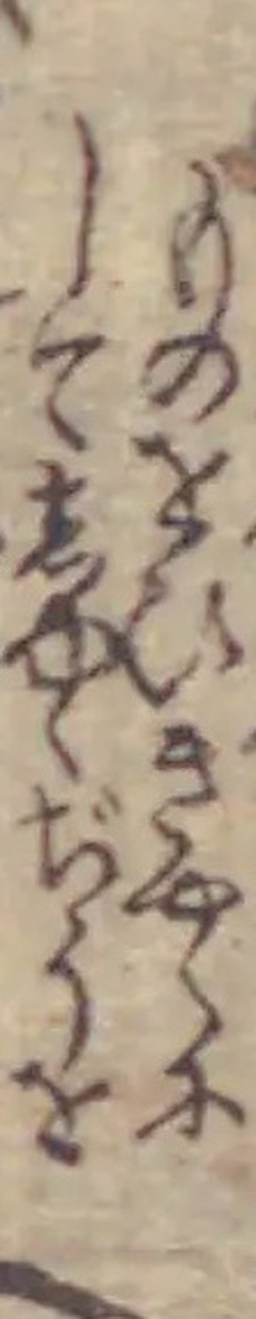してしゆくぢうを
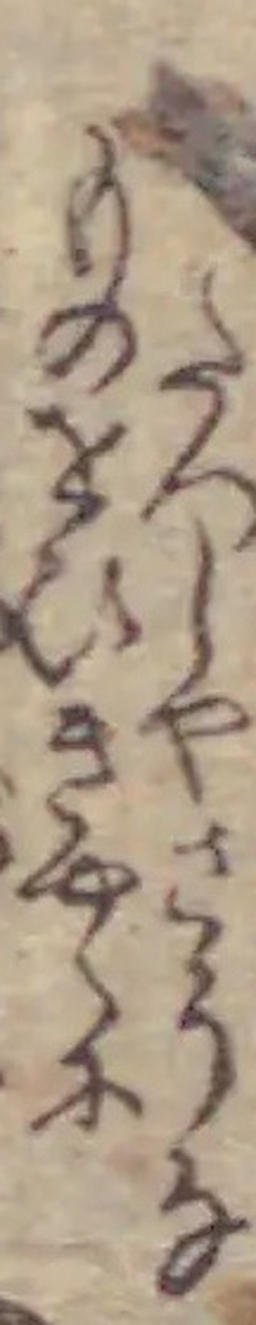ものをひきやくに
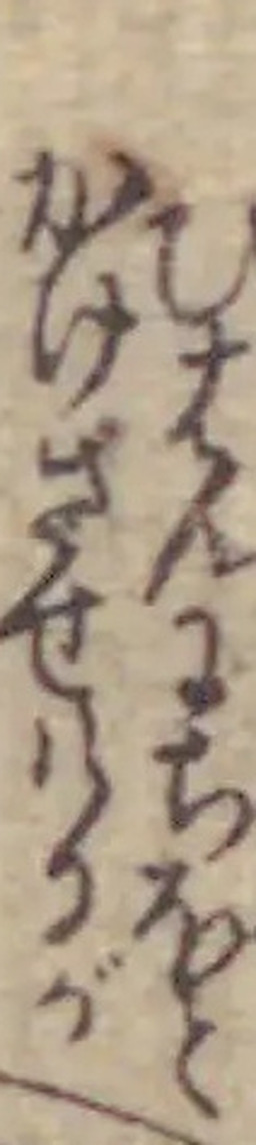かけさせけるが
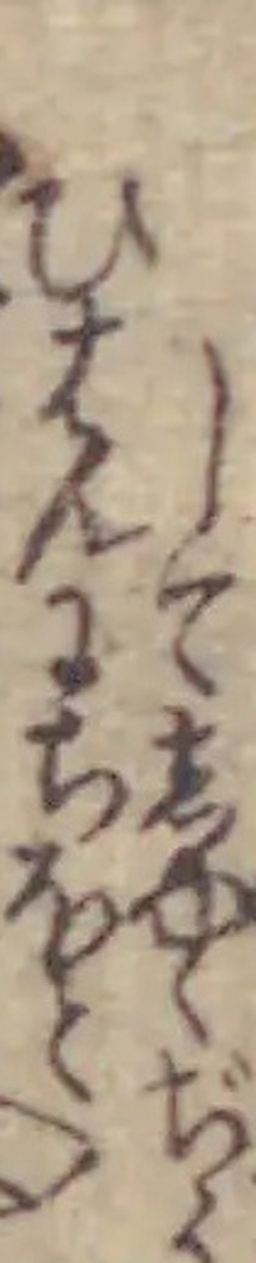ひはんにちほと
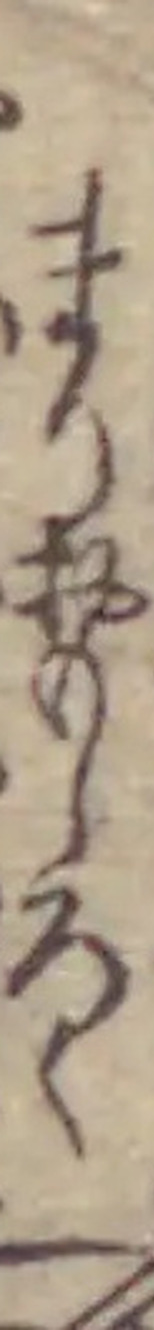まりおもしろく
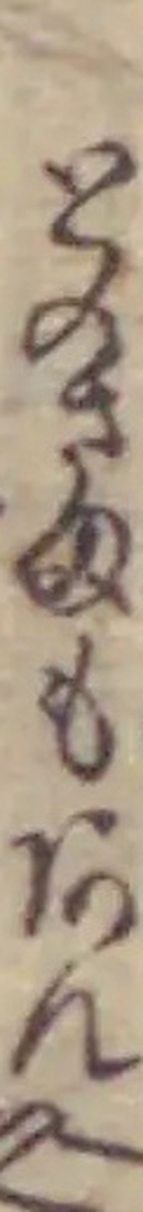とのさまもあん
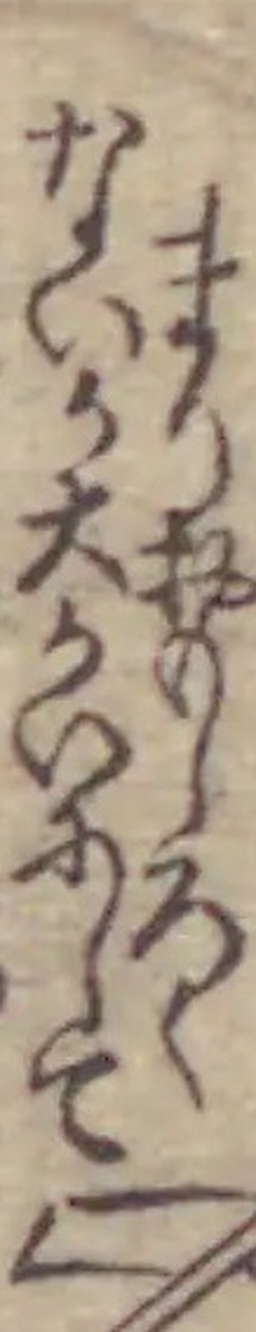ないか大かいにして
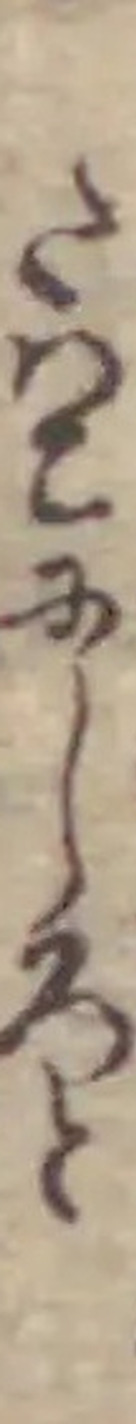たはこにしろと
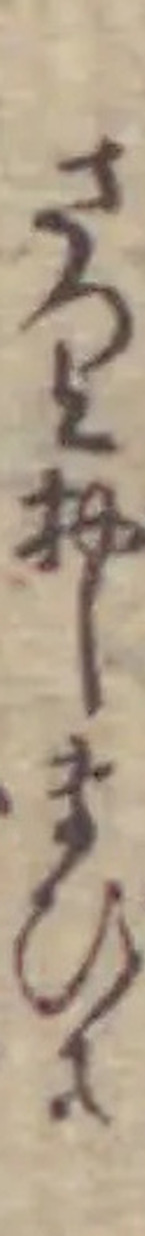さつとおしまひに
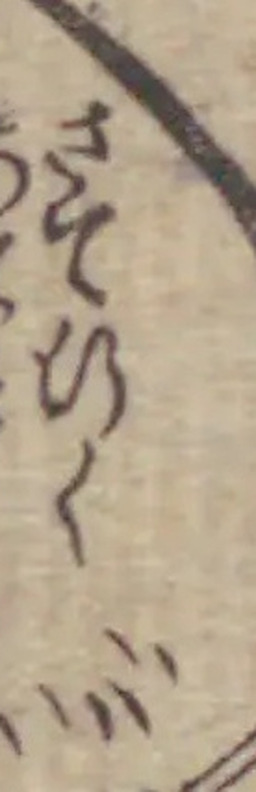さて行く
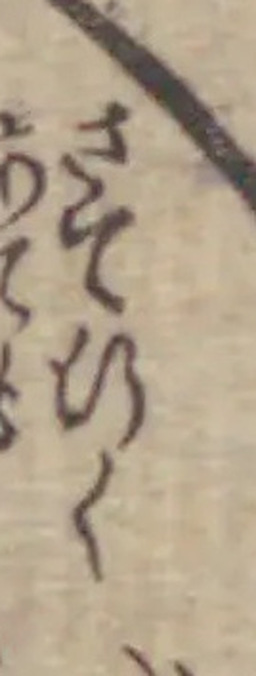あても
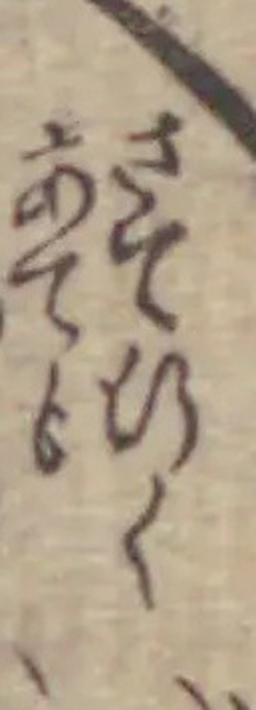あても
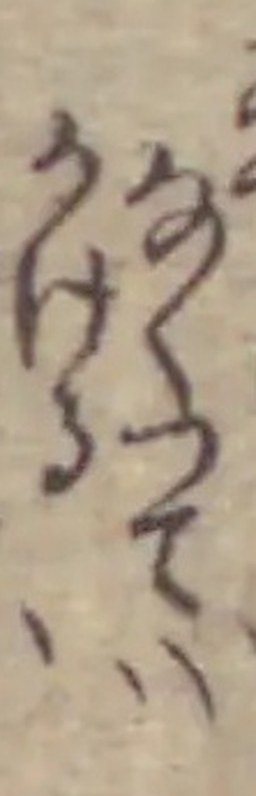かける
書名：道笑双六
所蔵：国立国会図書館 National Diet Library, JAPAN
